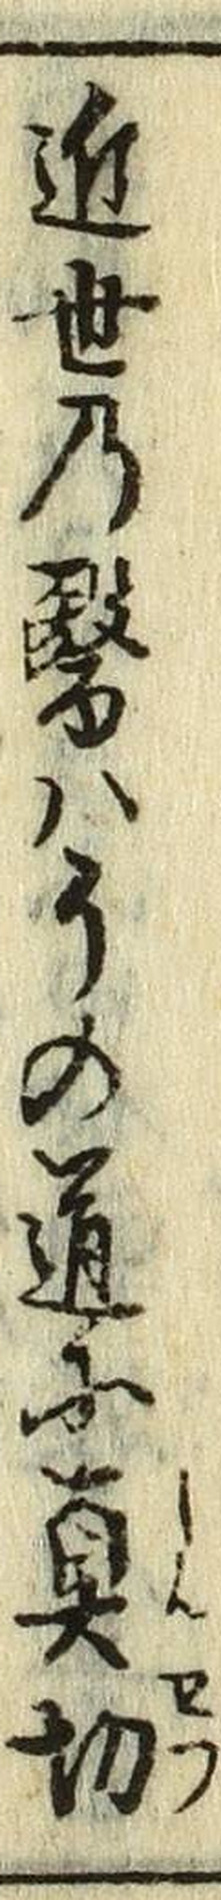近世の医はその道に真切
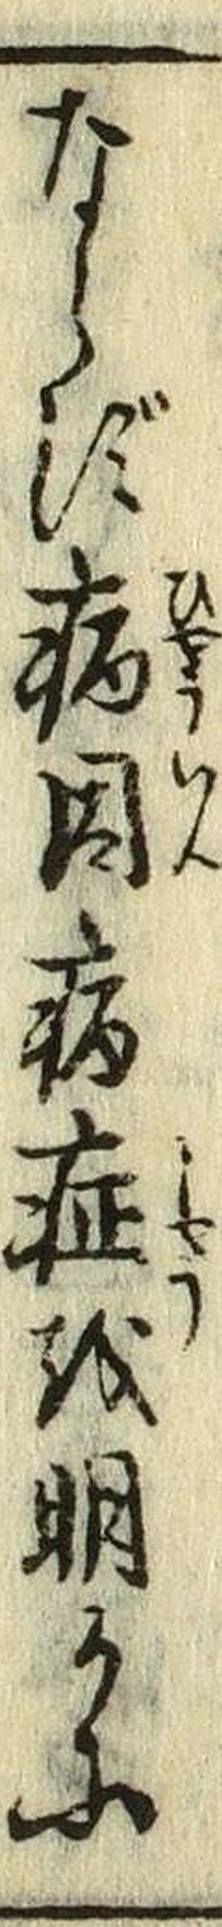ならず病因病症を明かに
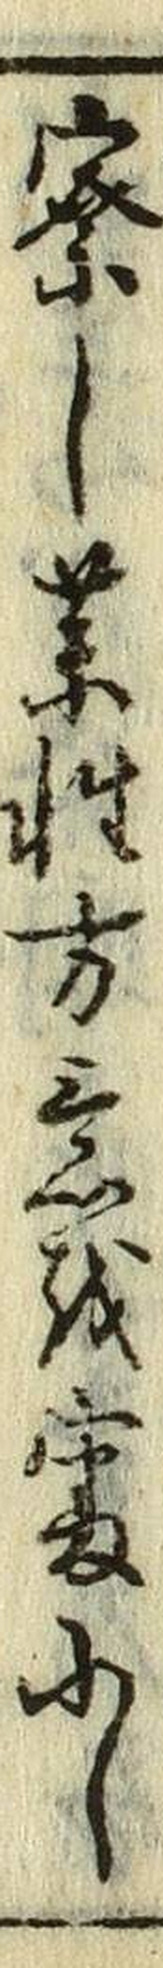察し薬性方意を審にし
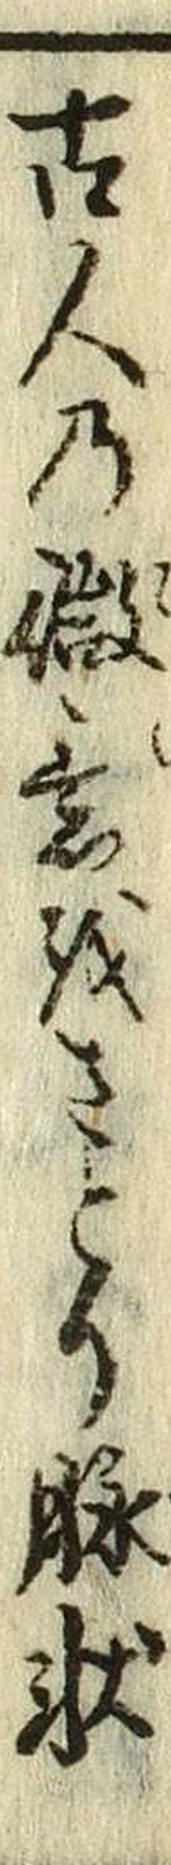古人の微意をさとり脈状
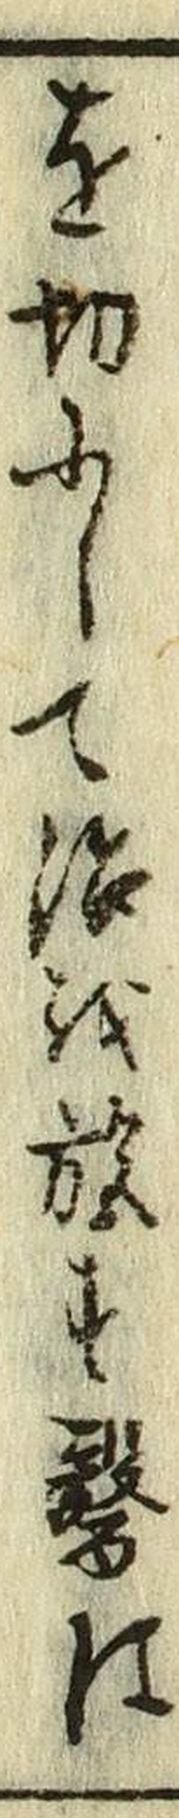を切にして治を施す医は
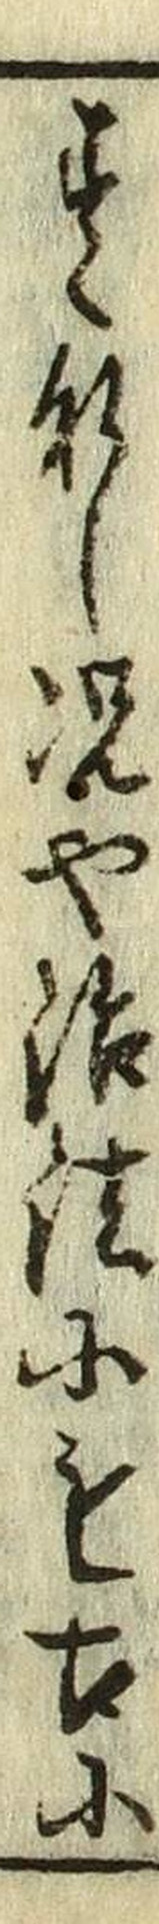すくなし況や治法にも古に
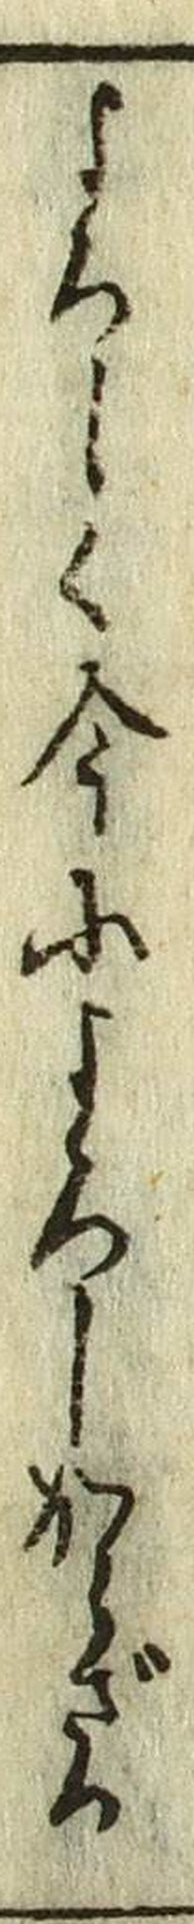よろしく今によろしからざる
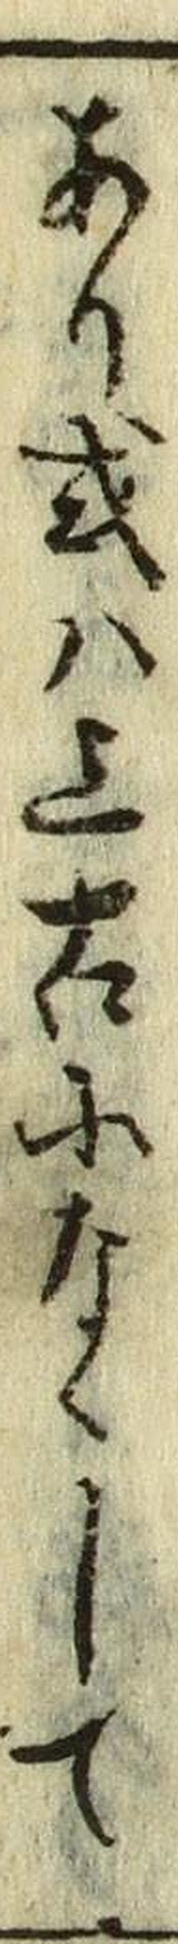あり或は上古になくして

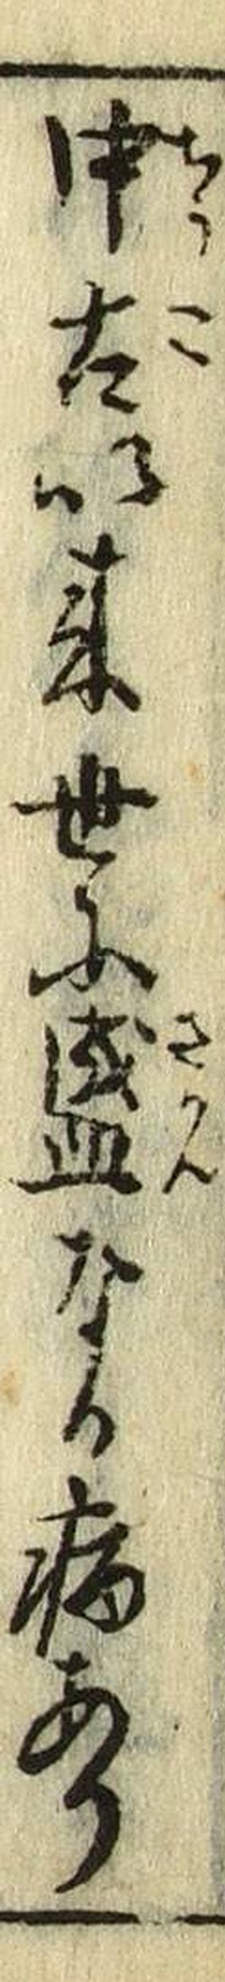中古以来世に盛なる病あり
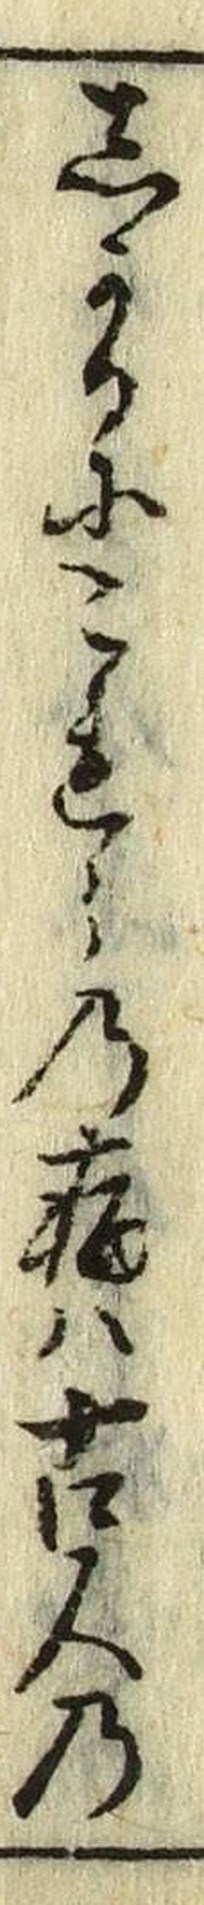しかるにこれらの病は古人の
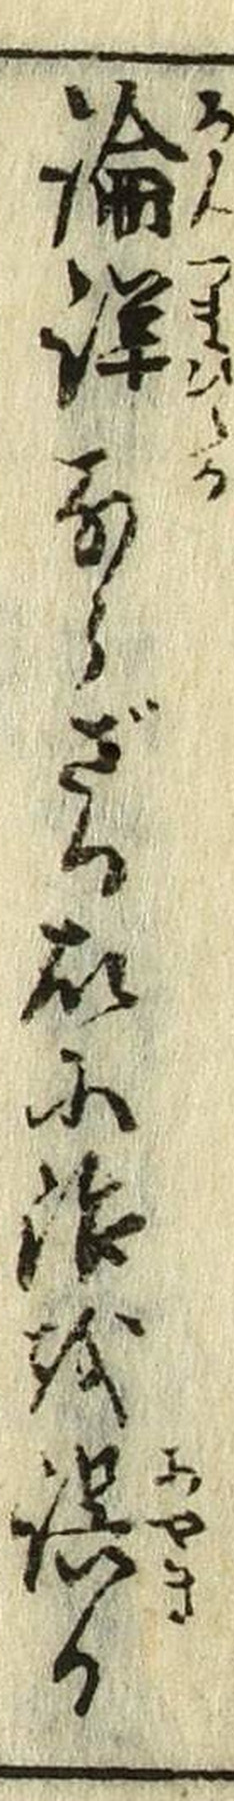論詳ならざる故に治を誤る
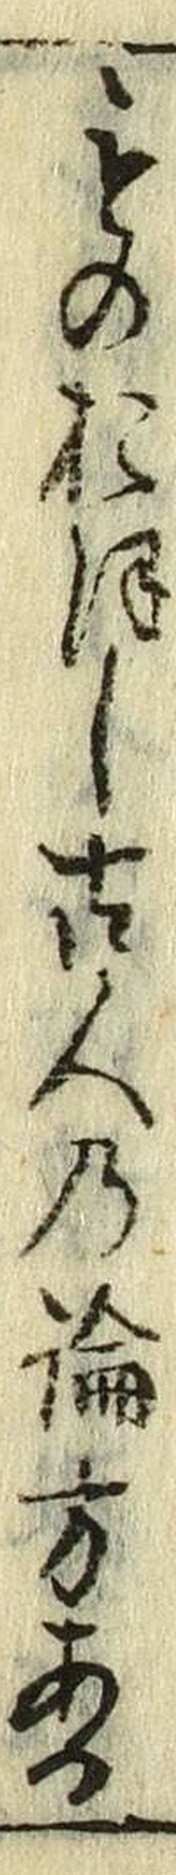ものおほし古人の論方ある
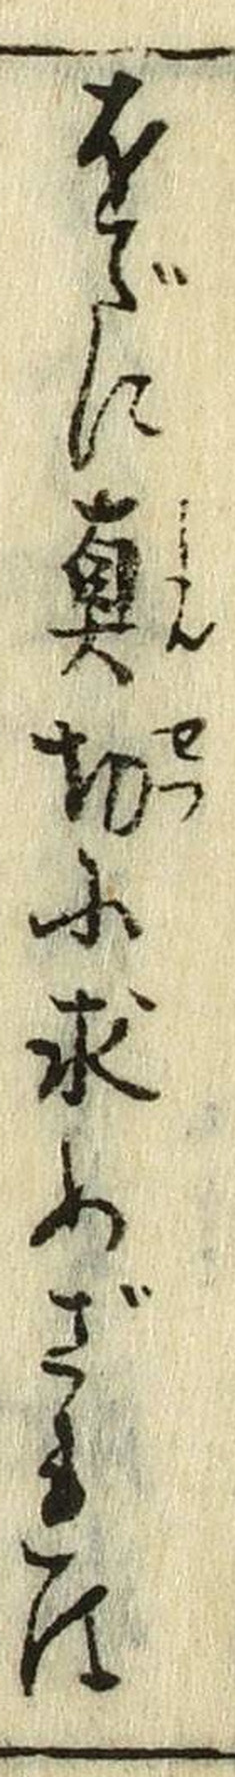をだに真切に求めざれは
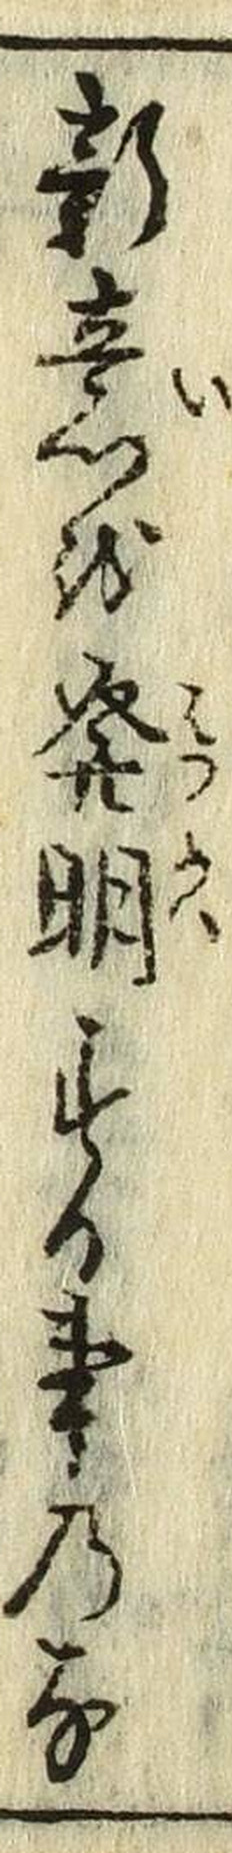新意を発明する事のな
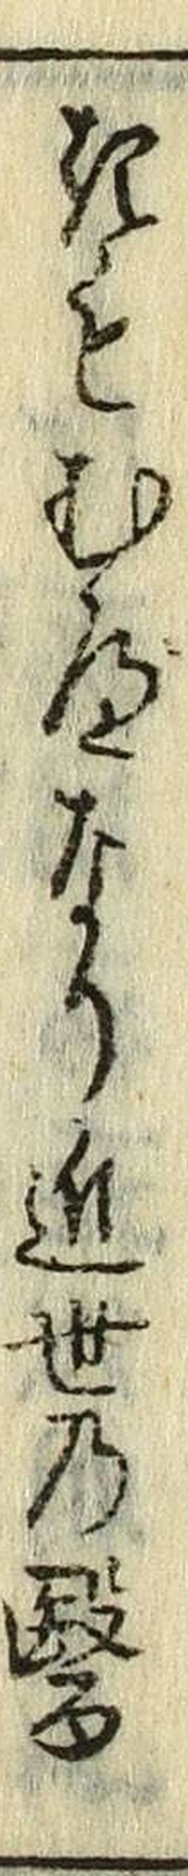きもむべなり近世の意医
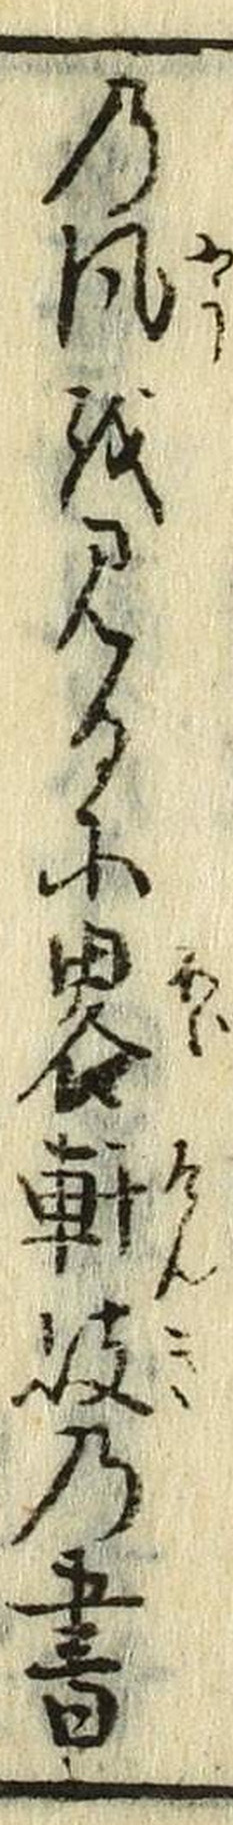の風を見るに略軒岐の書
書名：居家養生記
